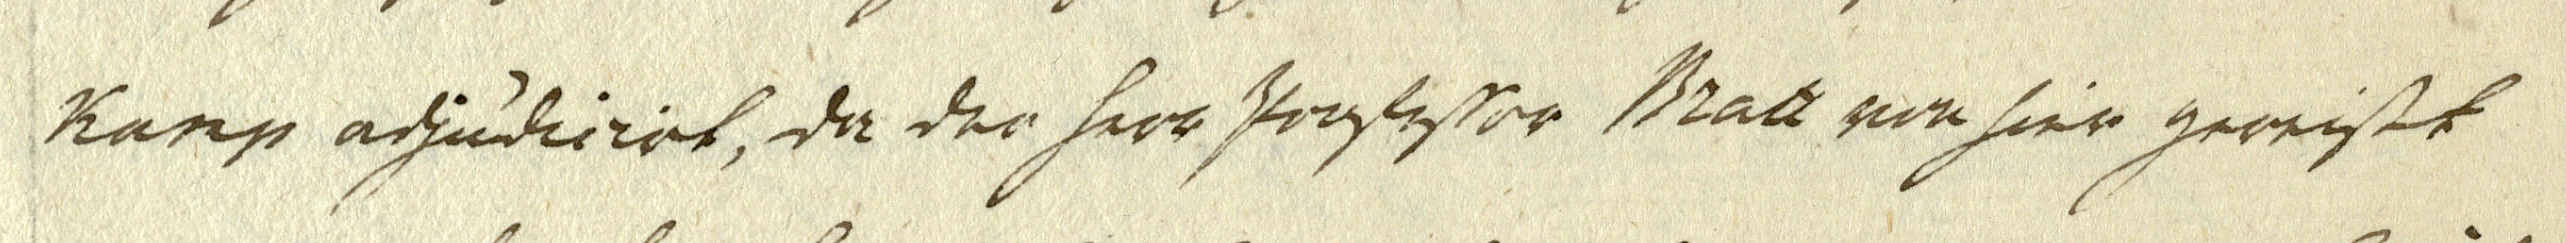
kamp adjudicirt, da der Herr Professor Bratt von hier gereiset
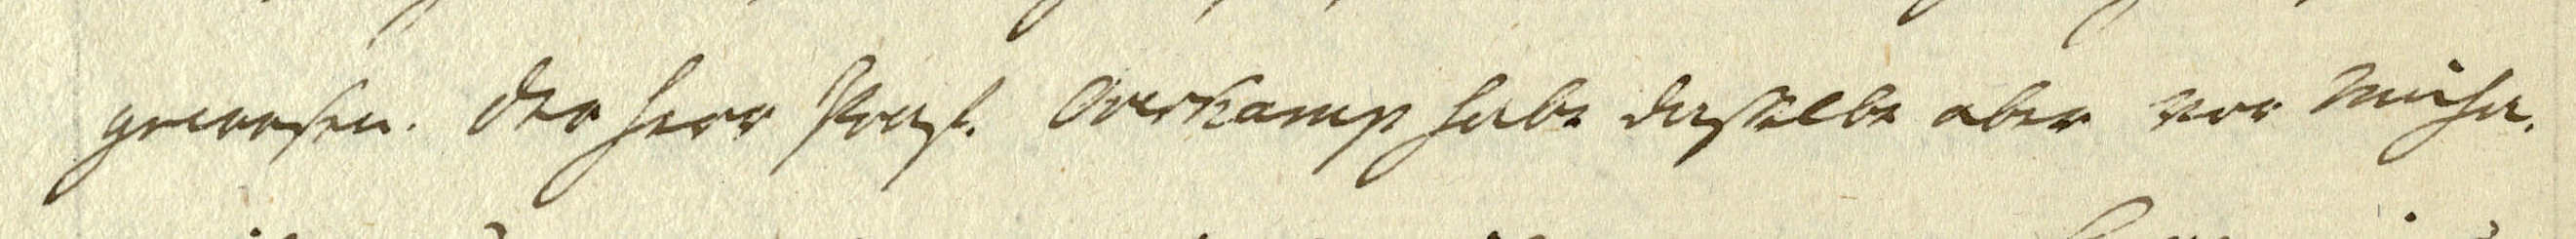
gewesen. Der Herr Prof. Overkamp habe dasselbe aber vor Micha¬
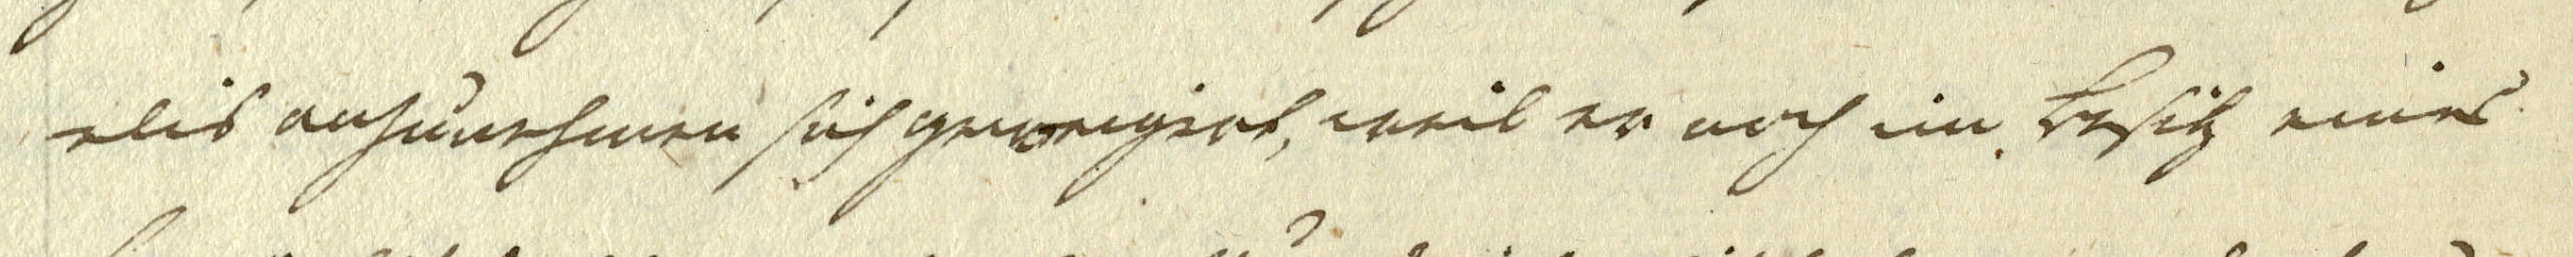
elis anzunehmen sich geweigert, weil er noch im Besitz eines
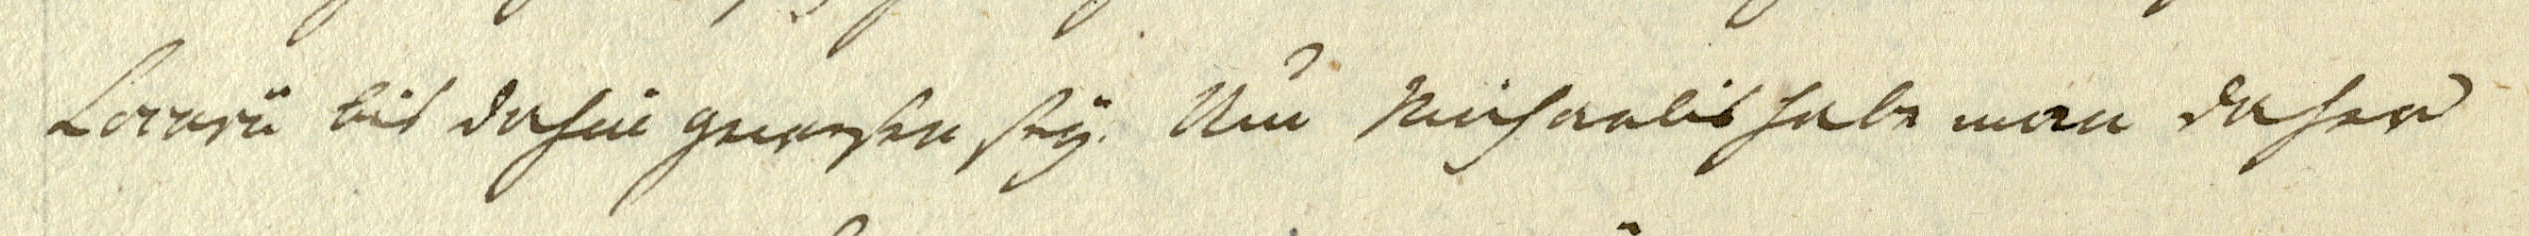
Locarii bis dahin gewesen seÿ. Um Michaelis habe man daher
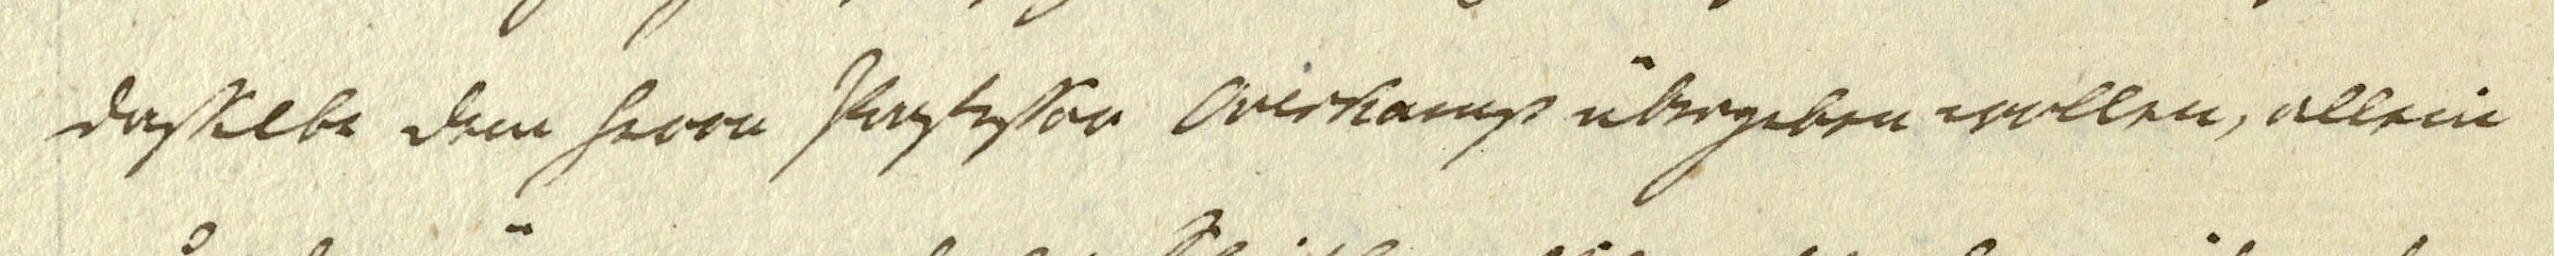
dasselbe dem Herrn Professor Overkamp übergeben wollen, allein
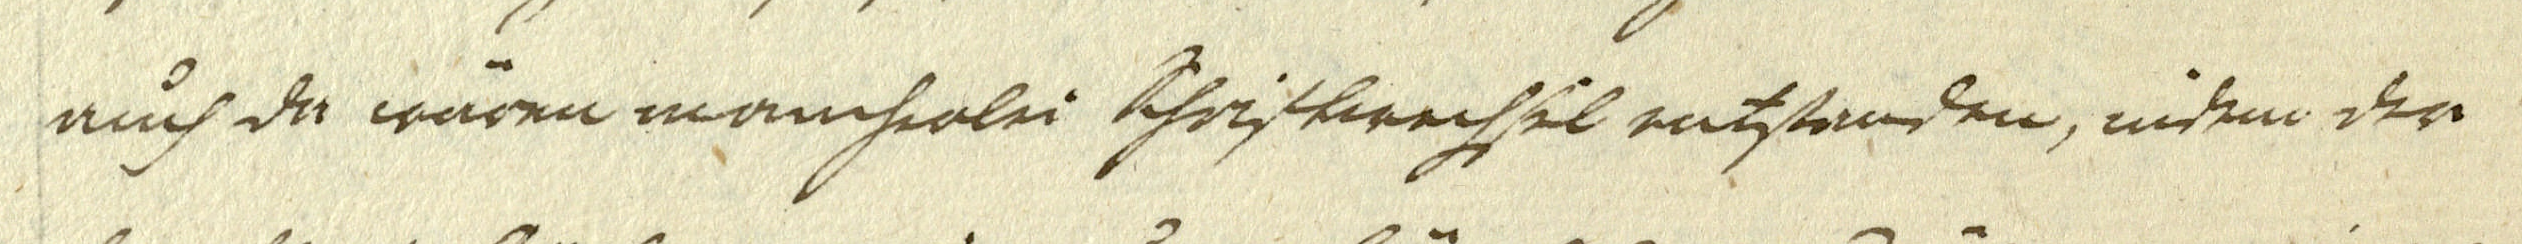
auch da wären mancherlei Schriftwechsel entstanden, indem der
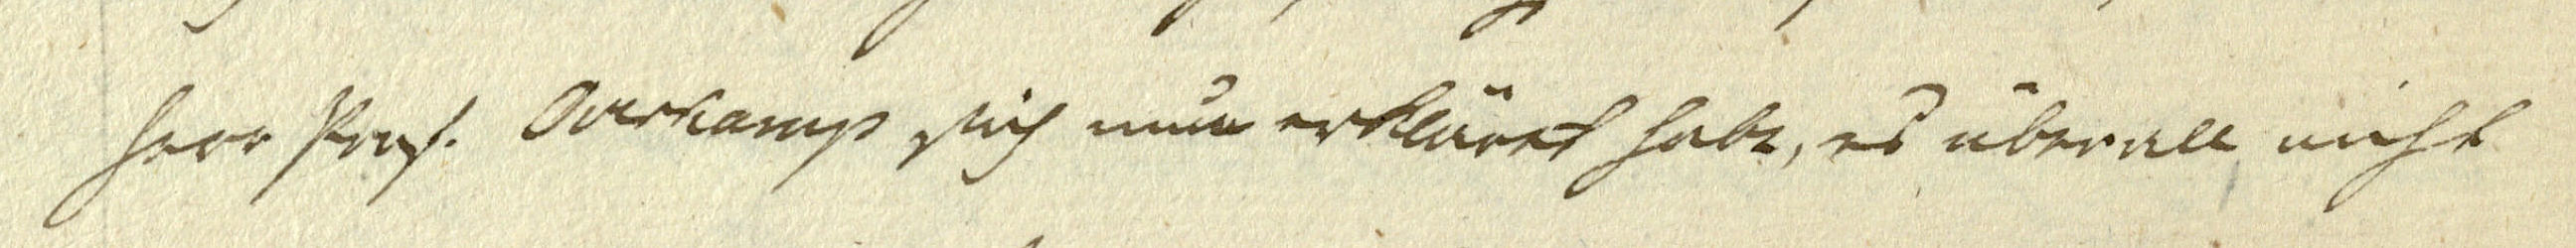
Herr Prof. Overkamp sich nun erkläret habe, es überall nicht
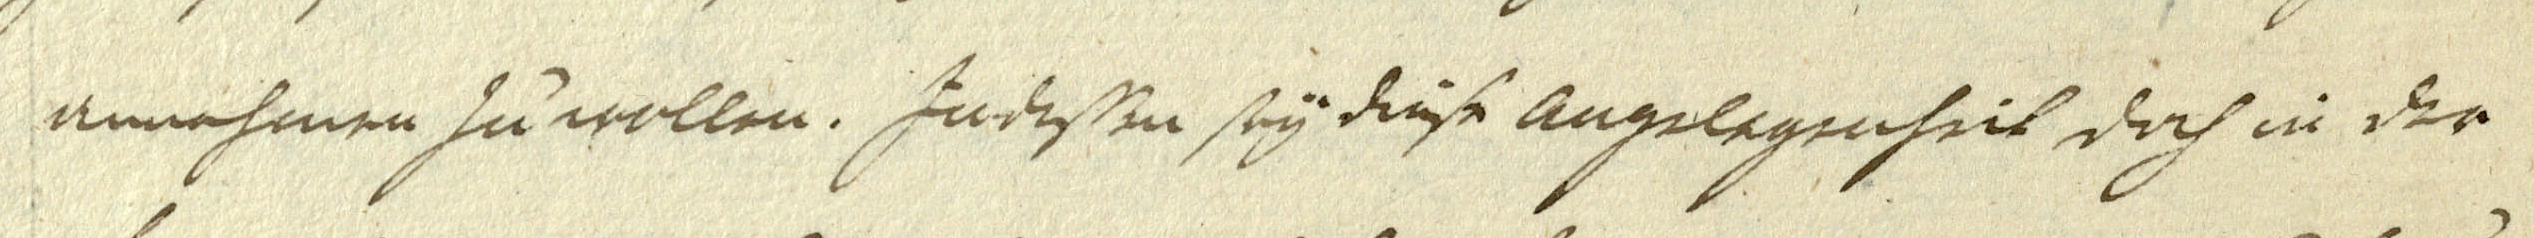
annehmen zu wollen. Indessen seÿ diese Angelegenheit doch in der
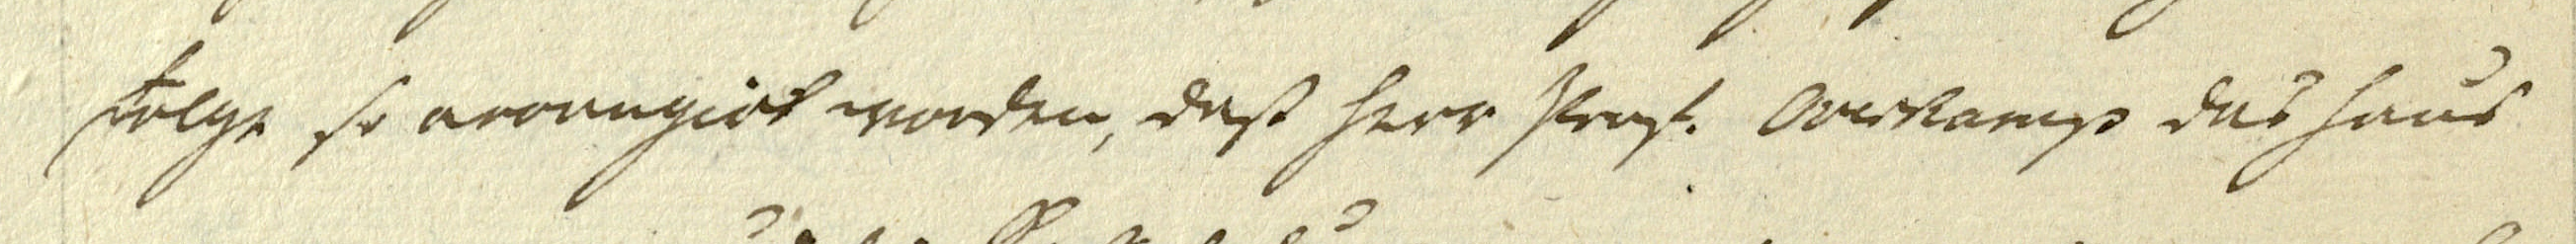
Folge so arrangirt worden, daß Herr Prof. Overkamp das Haus
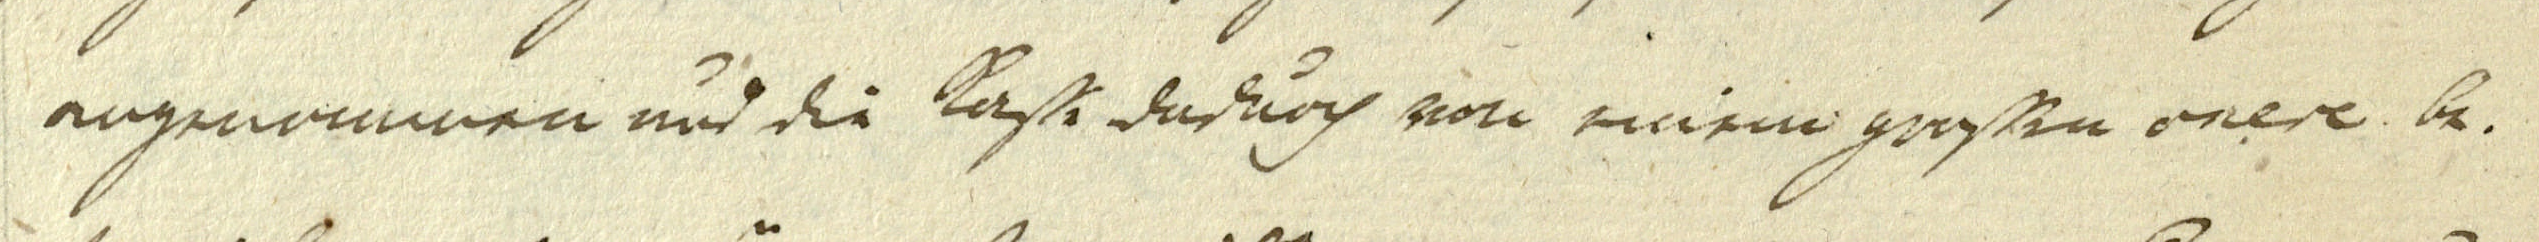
angenommen und die Kasse dadurch von einem grossen onere be¬
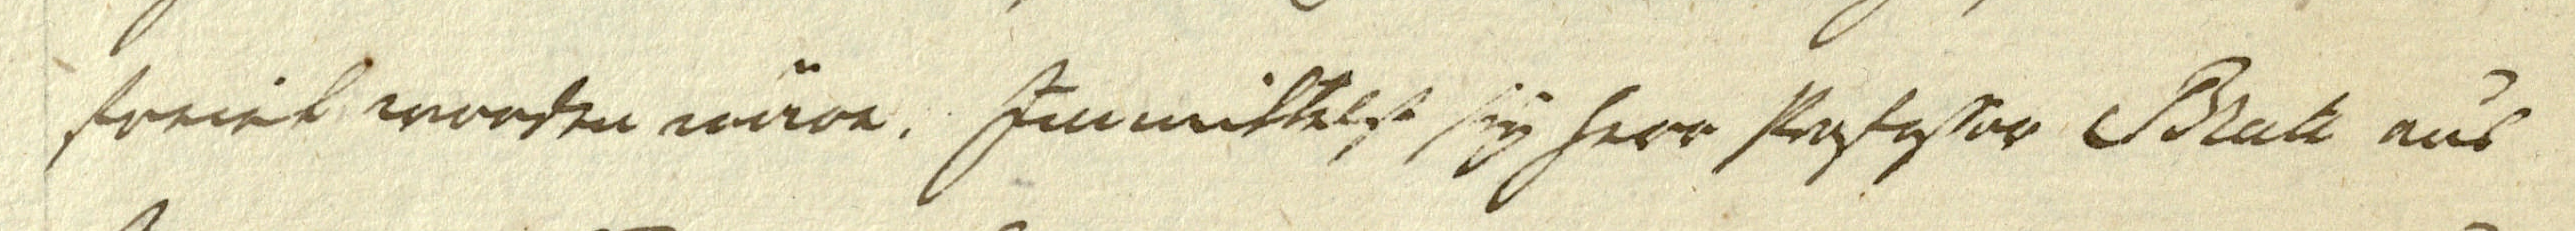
freiet worden wäre. Immittelst seÿ Herr Professor Bratt aus
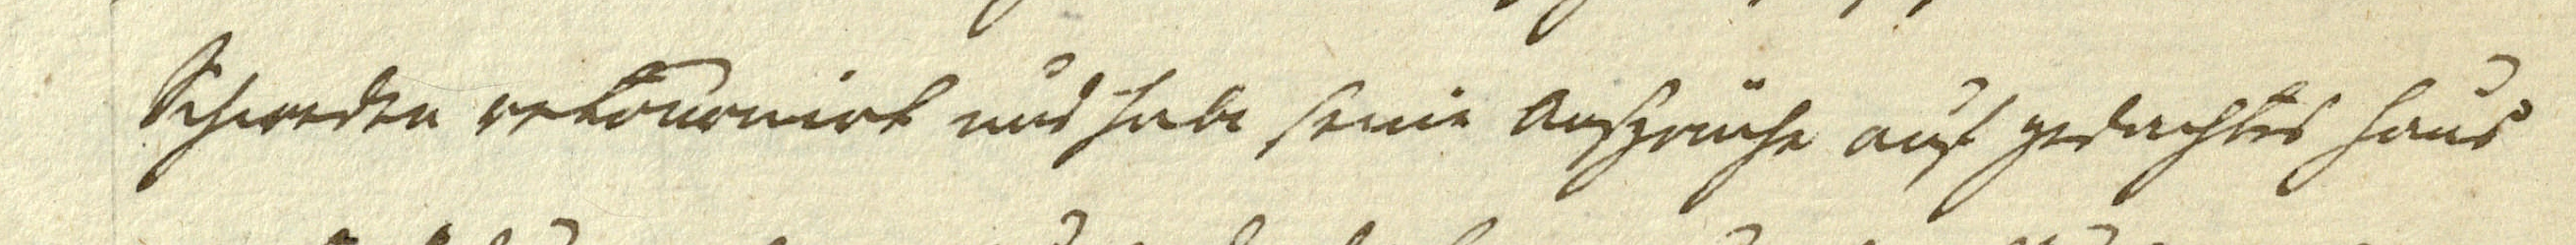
Schweden retournirt und habe seine Ansprüche auf gedachtes Haus
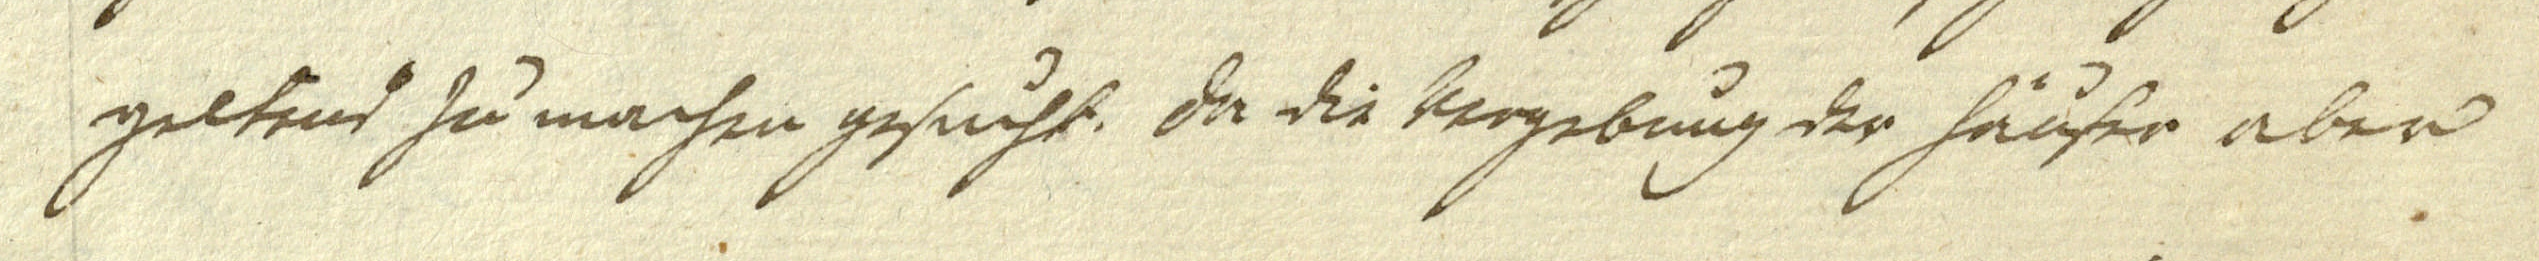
geltend zu machen gesucht. Da die Vergebung der Häuser aber
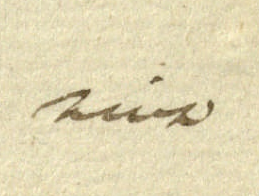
eine
